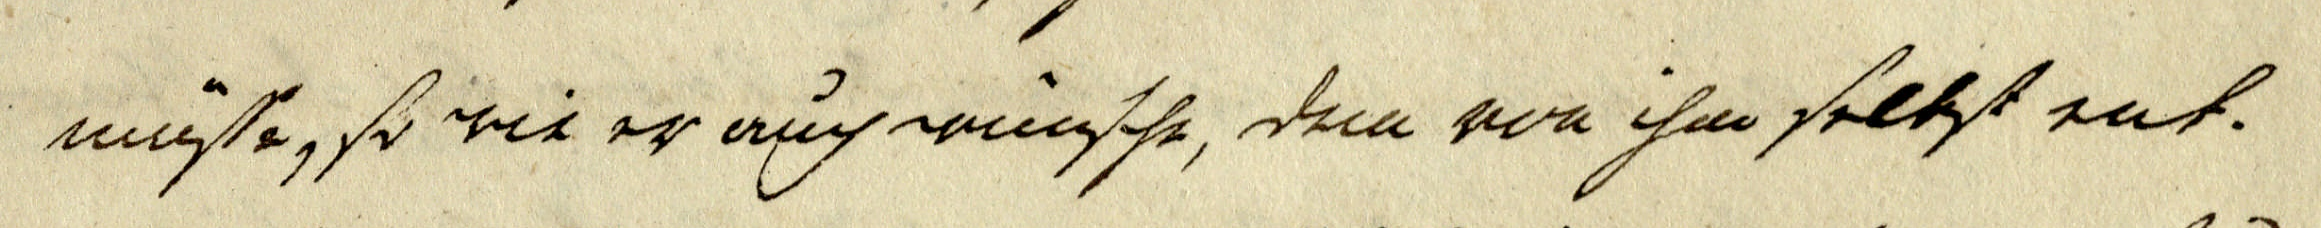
müsse, so wie er auch wünsche, dem von ihm selbst ent¬
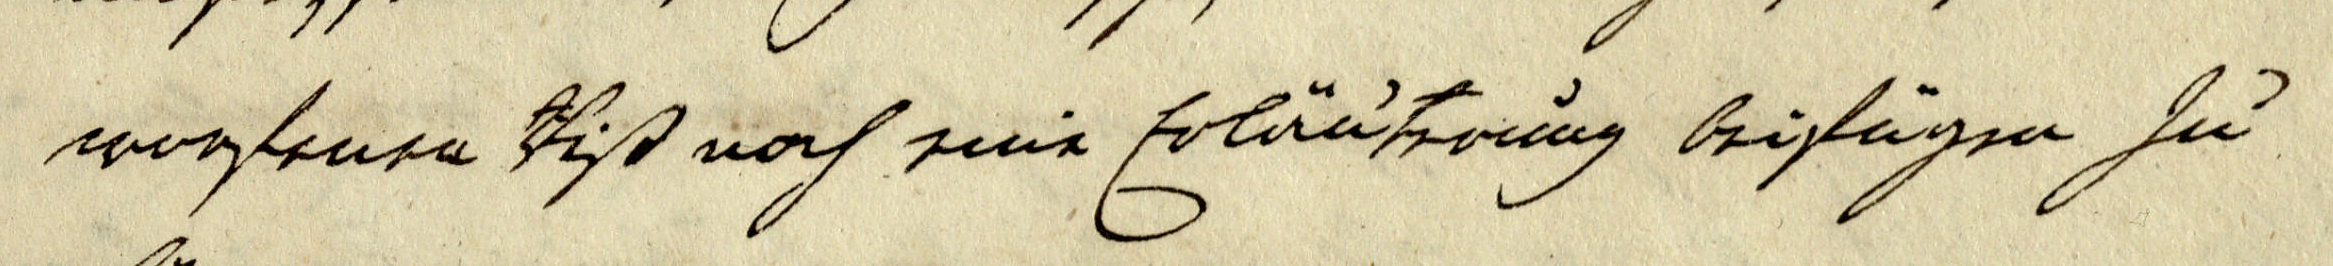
worfenen Riß noch eine Erläuterung beifügen zu
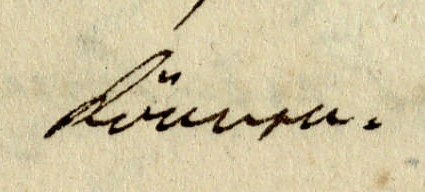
können.
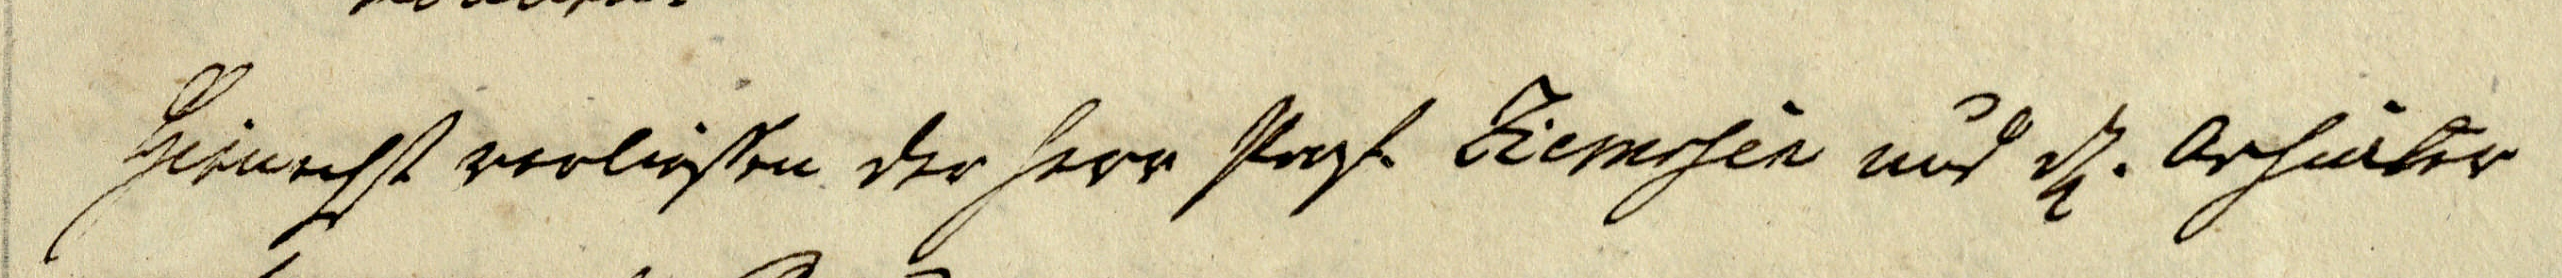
Hienechst verliessen der Herr Prof. Ziemssen und dh. Archiater
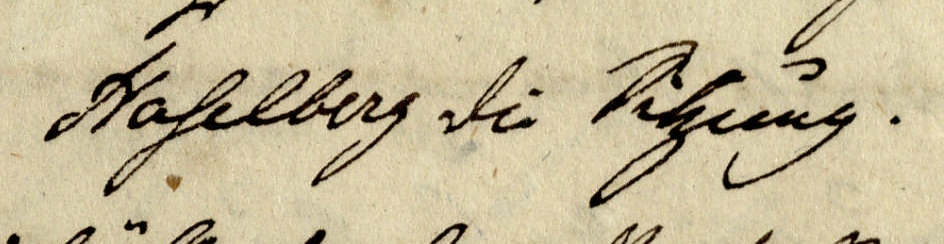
Haselberg die Sitzung.
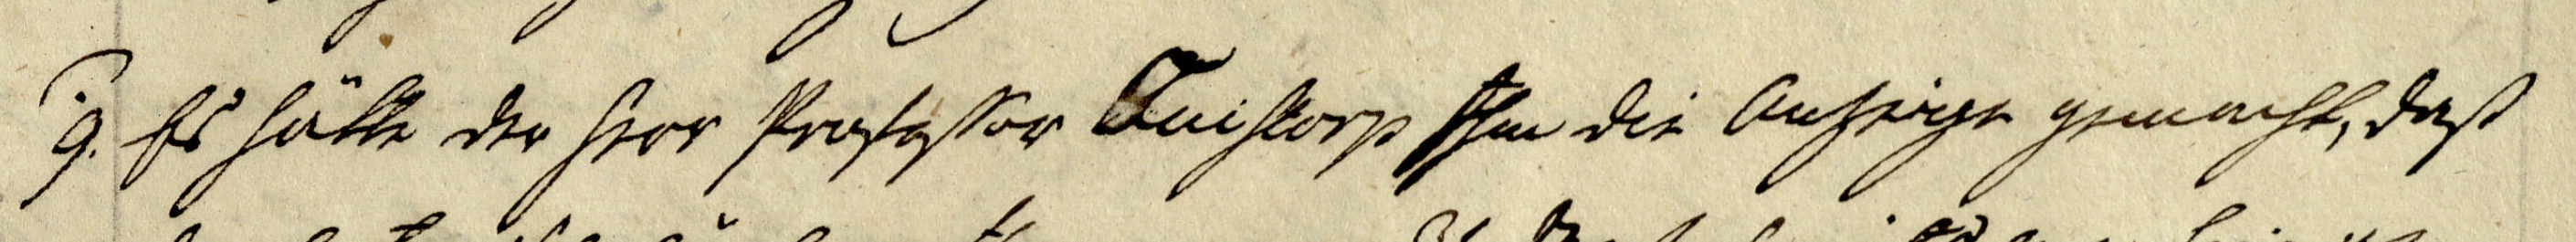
9. Es hätte der Herr Professor Quistorp Ihm die Anzeige gemacht, daß
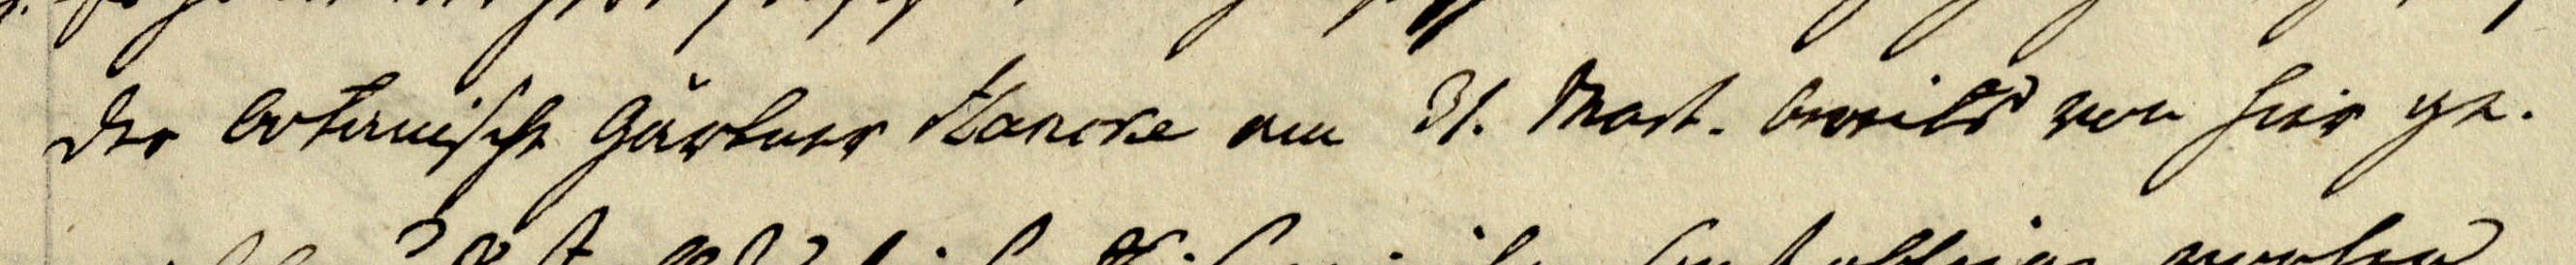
der botanische Gärtner Hancke am 31. Mart. bereits von hier ge¬
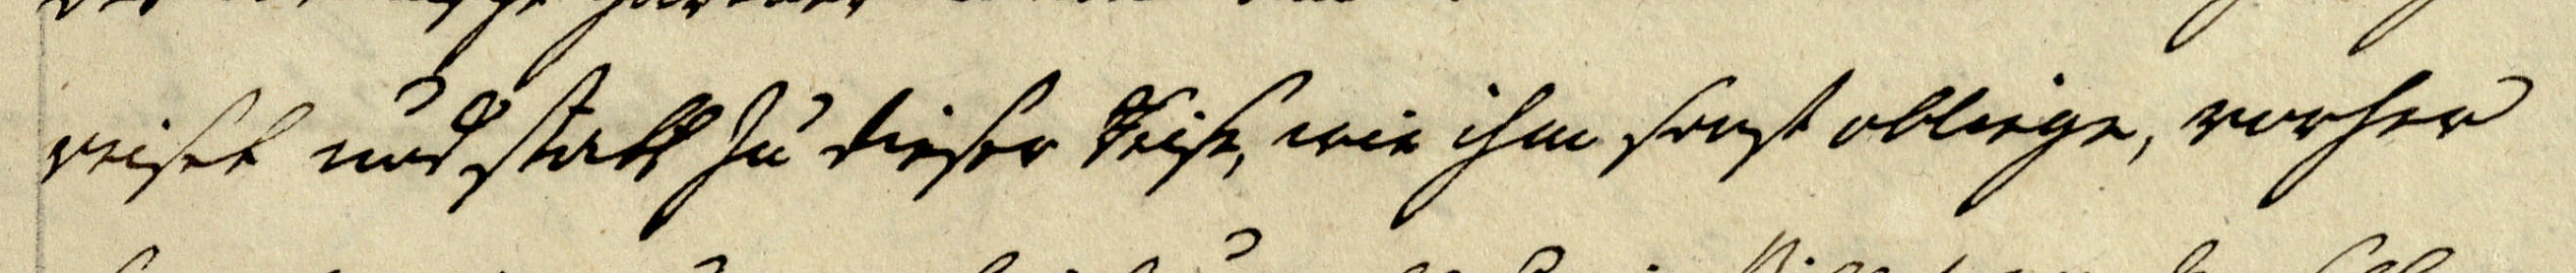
reiset und statt zu dieser Reise, wie ihm sonst obliege, vorher
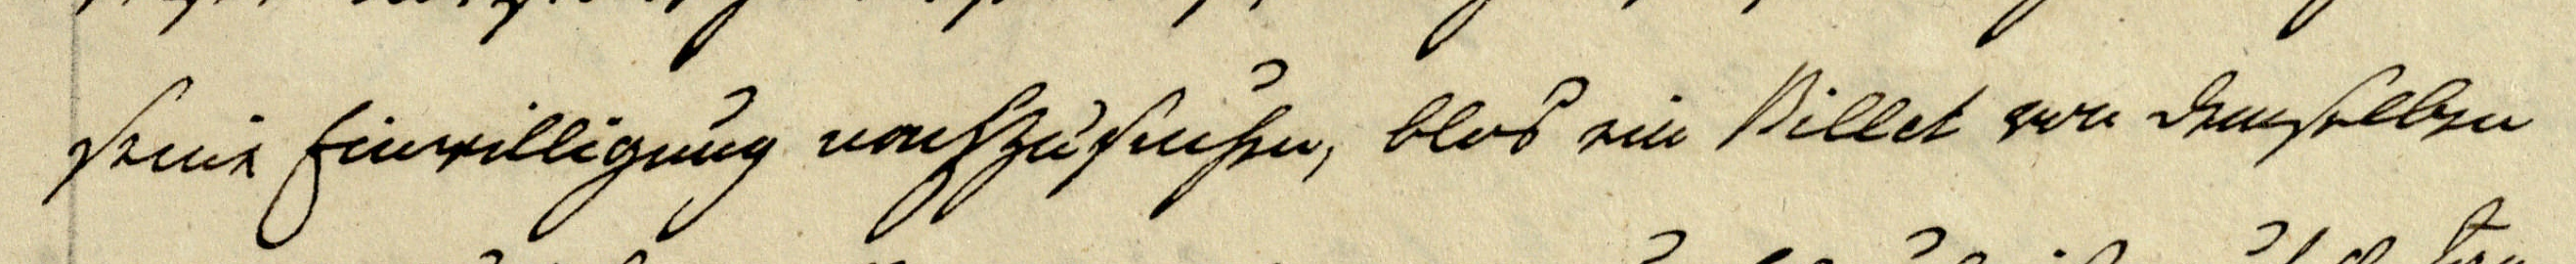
seine Einwilligung nachzusuchen, blos ein Billet von demselben
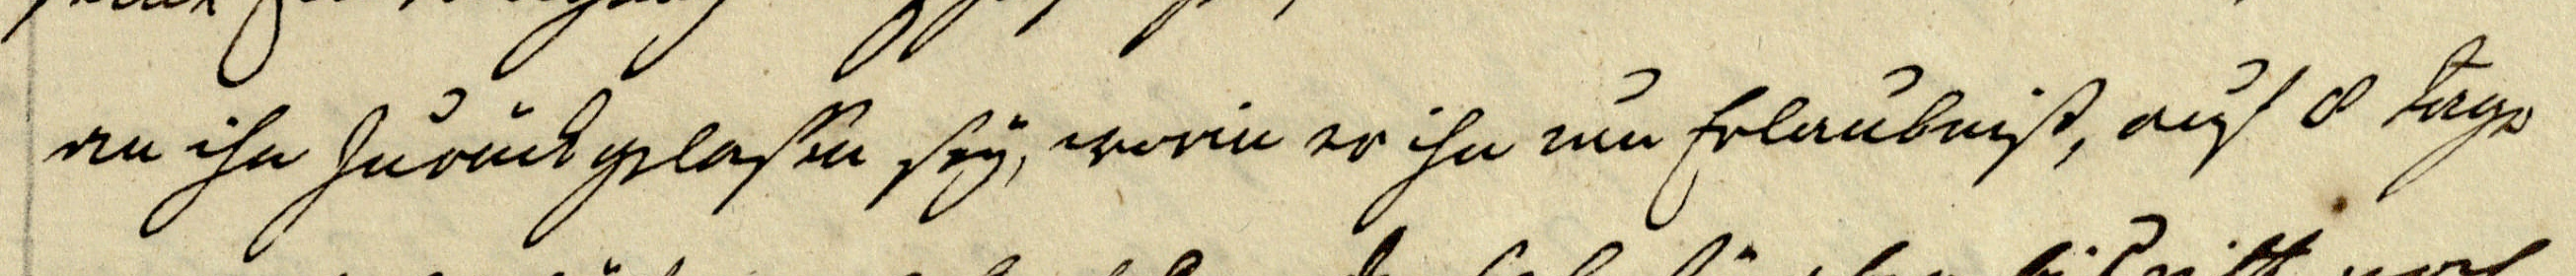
an ihn zurückgelassen seÿ, worin er ihn um Erlaubniß, auf 8 Tage
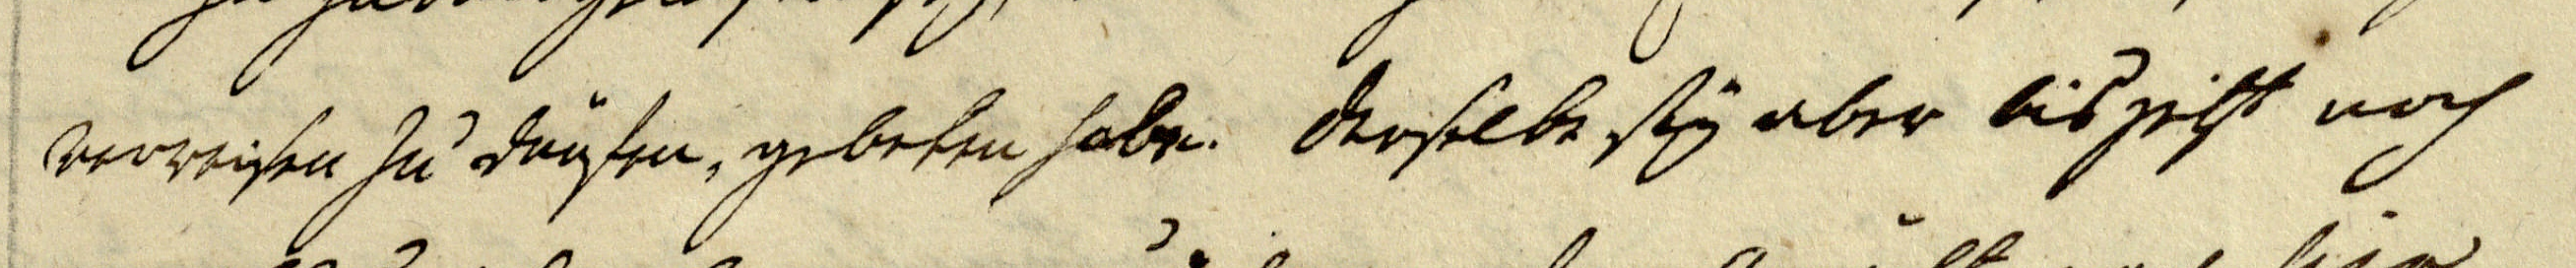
verreisen zu dürfen, gebeten habe. Derselbe seÿ aber bis jetzt noch
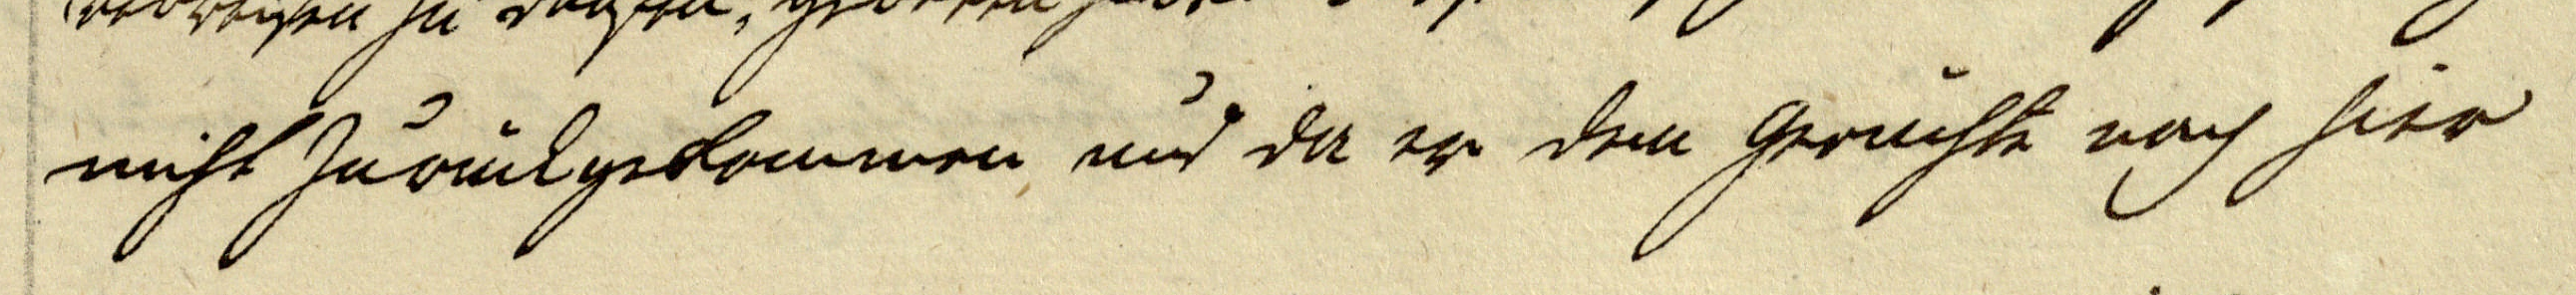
nicht zurückgekommen und da er dem Gerüchte nach hier
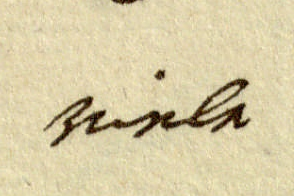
viele
